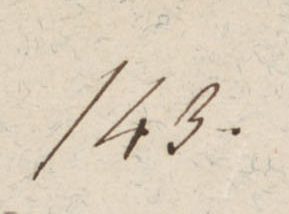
143.
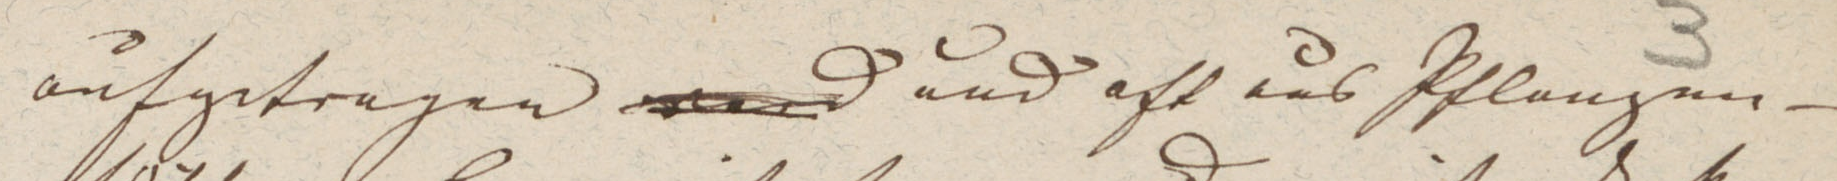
aufgetragen ward und oft aus Pflanzen-
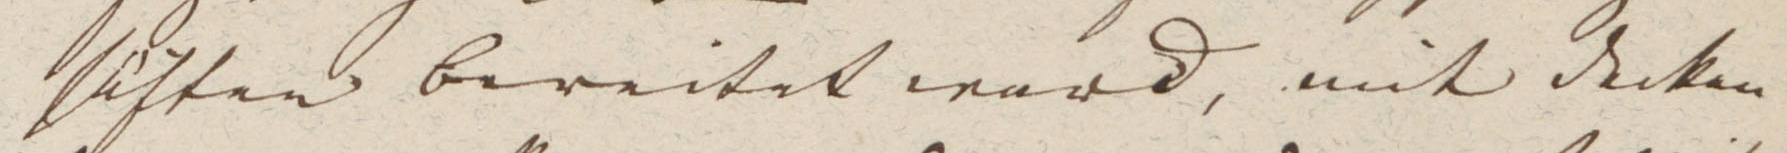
säften bereitet ward, mit decken-
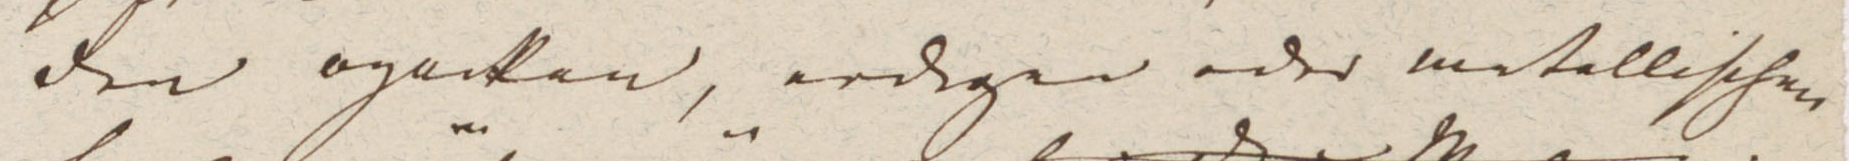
den opacken, erdigen oder metallischen
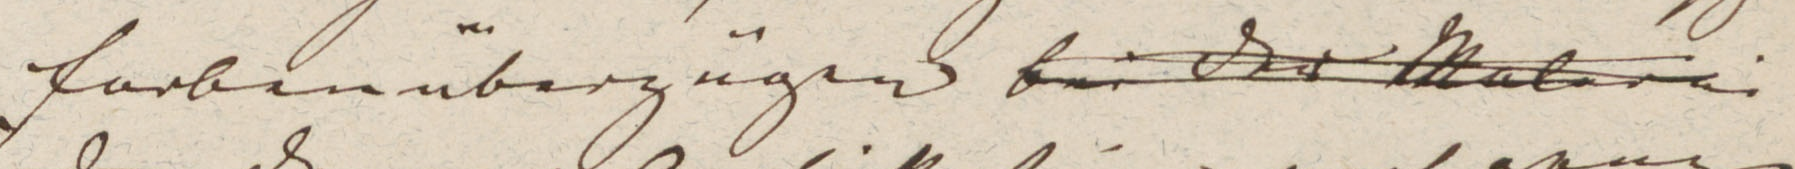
Farbenüberzügen bei der Malerei
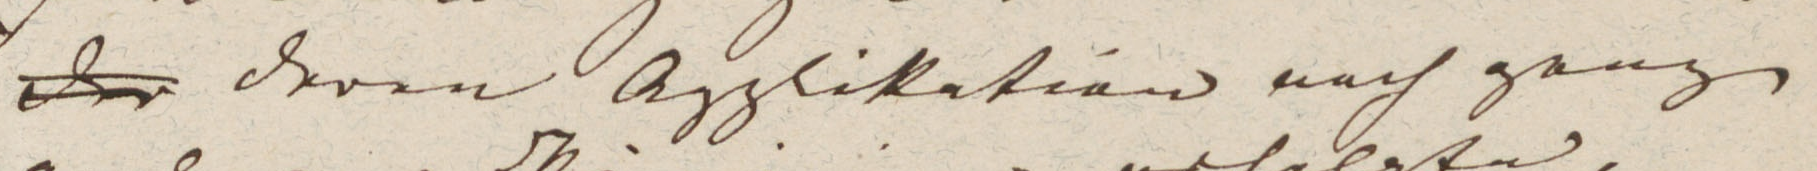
der deren Applikation nach ganz
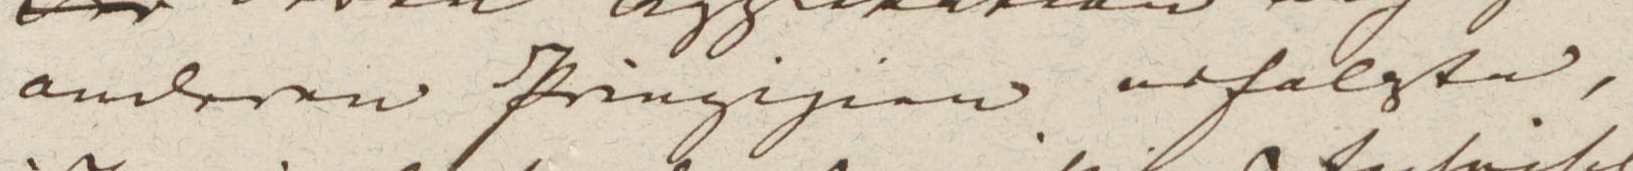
anderen Prinzipien erfolgte,
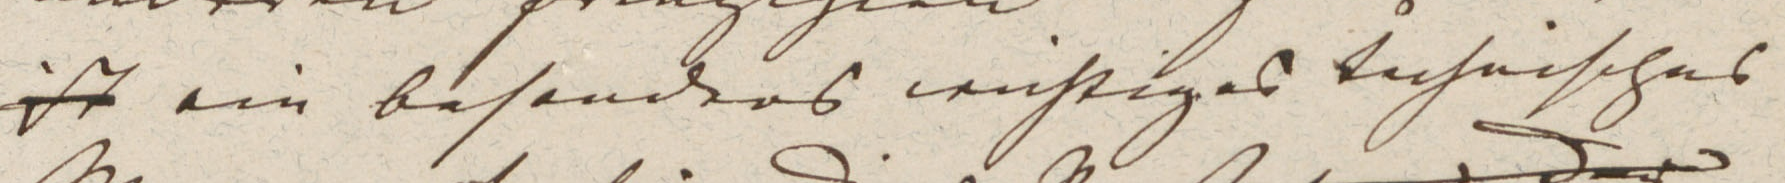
ist ein besonders wichtiges technisches
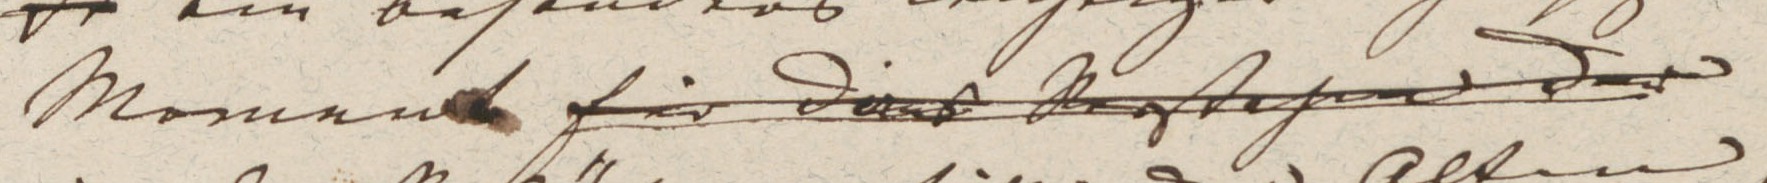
Moment für dies Verstehen der
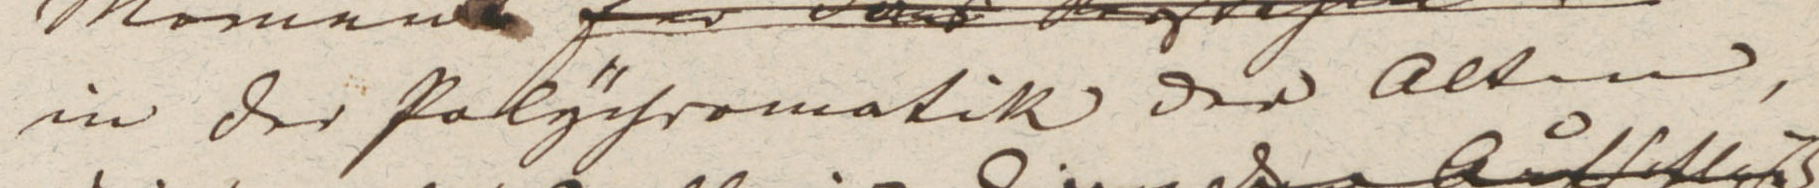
in der Polychromatik der Alten,
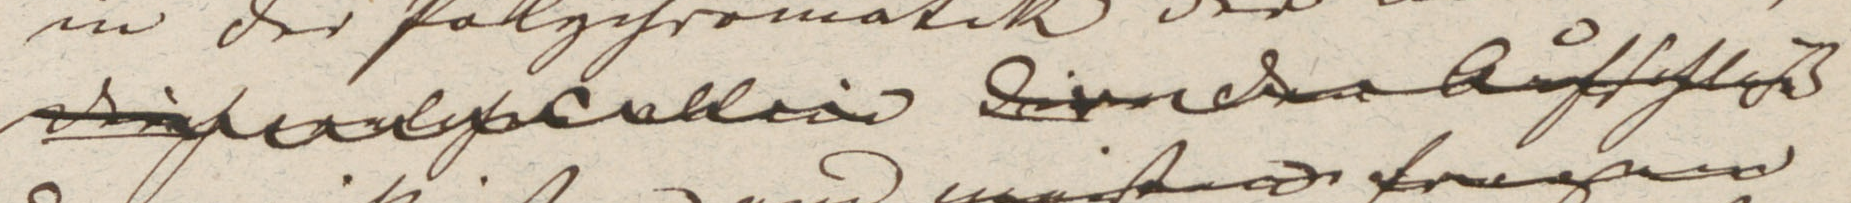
durch welches allein Die den Aufschluss
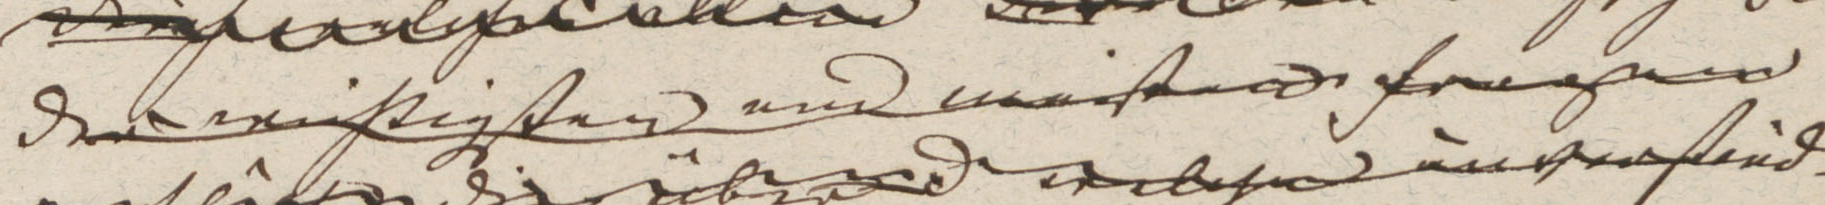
der wichtigsten und meisten Fragen
